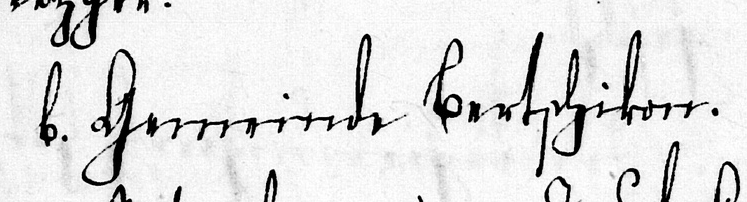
b. Gemeinde Bertschikon.
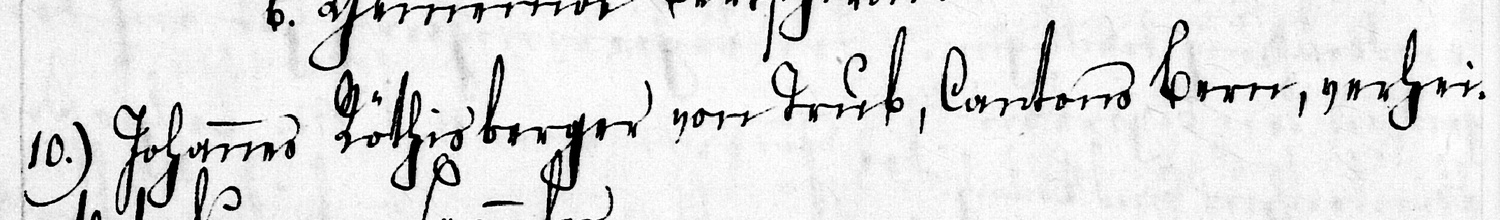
10.) Johannes Röthisberger von Trub, Cantons Bern, verhei¬
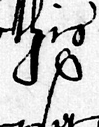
11.)
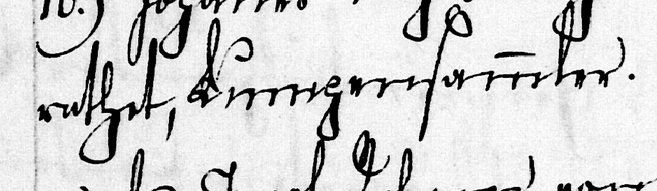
rathet, Lumpensammler.
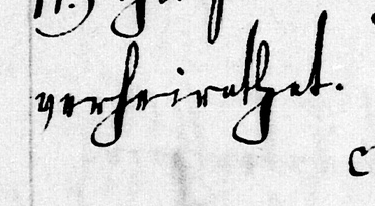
verheirathet.
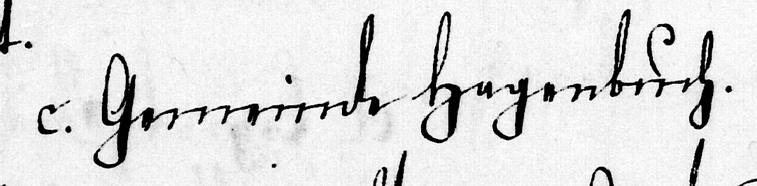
c. Gemeinde Hagenbuch.
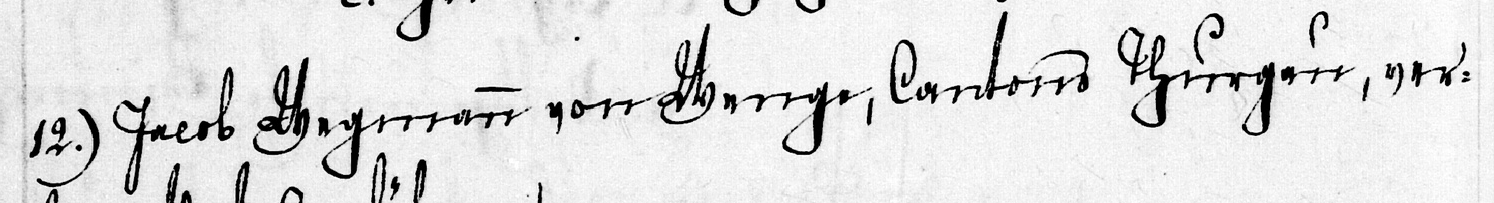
12.) Jacob Wegmann von Wenge, Cantons Thurgau, ver¬
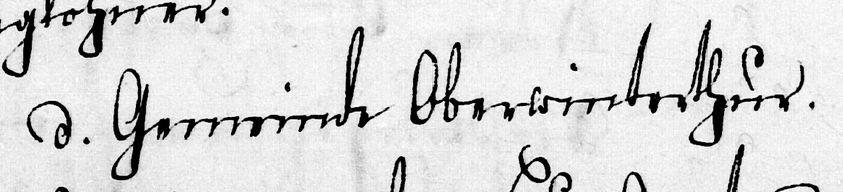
d. Gemeinde Oberwinterthur.
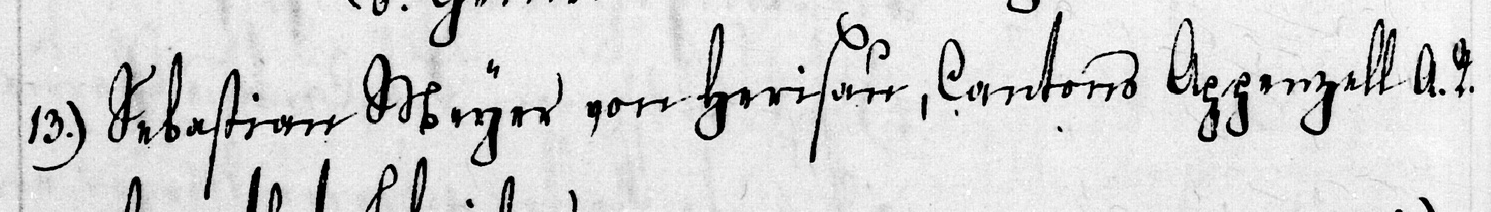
13.) Sebastian Meyer von Herisau, Cantons Appenzell A.
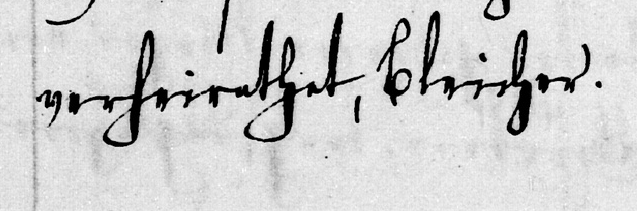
verheirathet, Bleicher.
